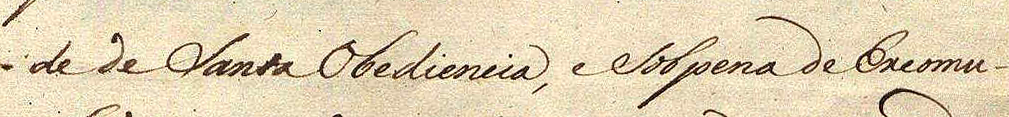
de de Santa Obediencia, e sob pena de Excomu
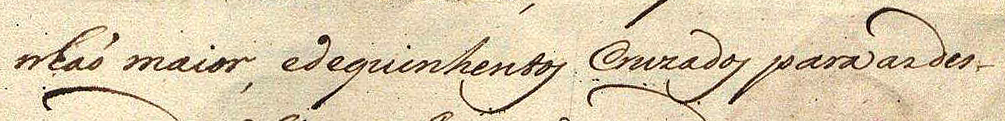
nhaõ maior, e de quinhentos cruzados para as des
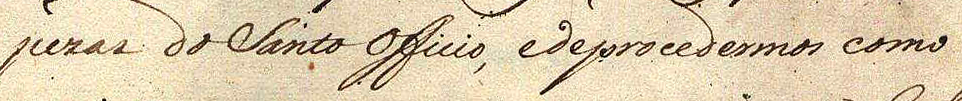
pezaz do Santo Officio, e de procedermos como
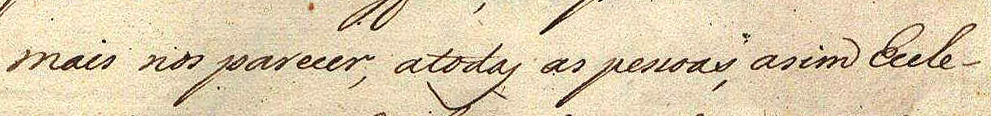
mais nos parecer, a todas as pessoas, asim Eccle
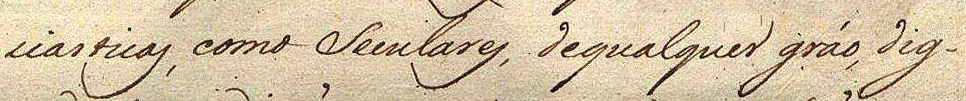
siasticas, como Seculares, de qualquer gráo, dig
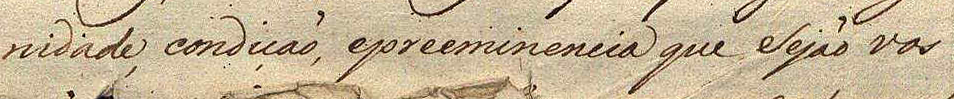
nidade, condiçaõ, e preeminencia que sejaõ vos
